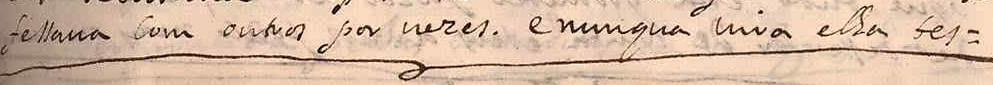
fessaua com outros por uezes. e nunqua uira ella tes
